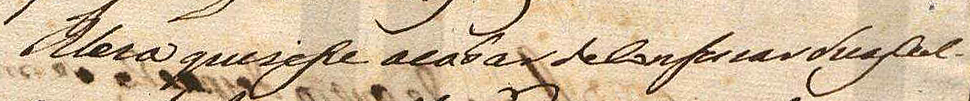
Meza quizesse acabar de Confessar suas Cul
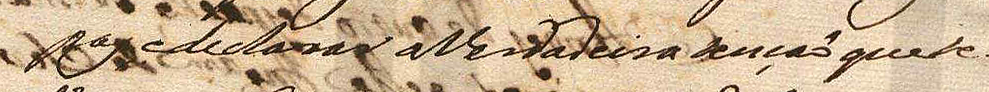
pas e declarar a Verdadeira tençaõ que te
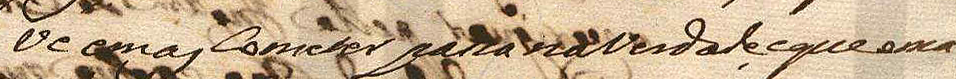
ve em as Cometer passa na verdade, e que o ma
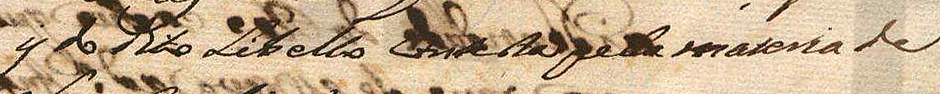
is do dito Libello Contesta pela materia de
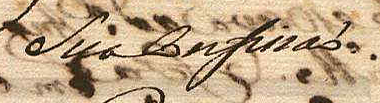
sua confissaõ.
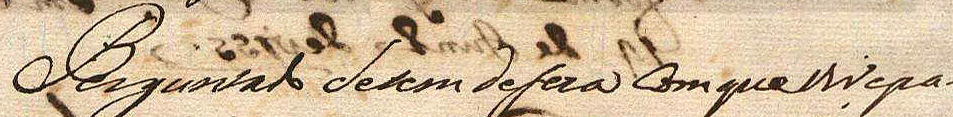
Perguntado se tem defeza Com que vir, e pa
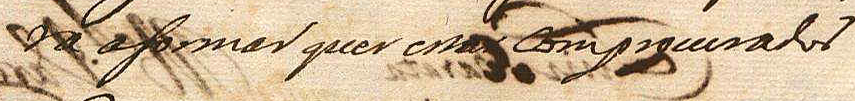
ra a formar quer estar com procurador
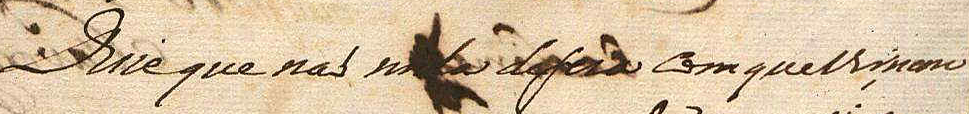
Disse que naõ ti_a defeza com que vir, nem
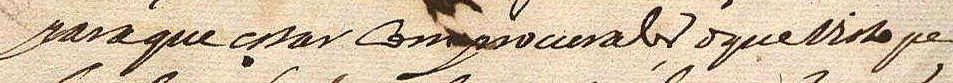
para que estar com procurador o que visto pe
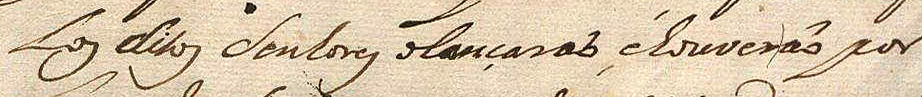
Los ditos Senhores o lançaraõ, e houveraõ por
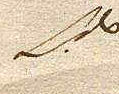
L.do
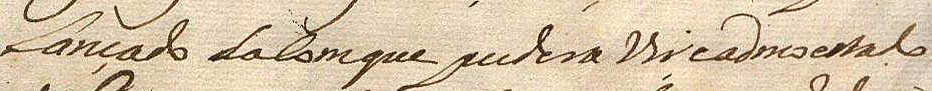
Lançado da Com que pudera vir, e admoestado
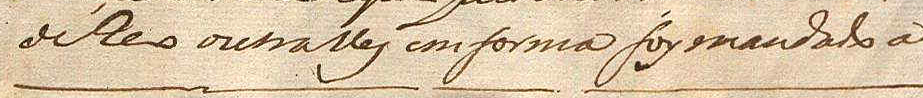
o Reo outra ves em forma foy mandado a
